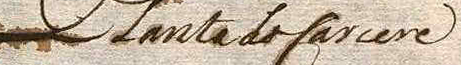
Planta do Carcere
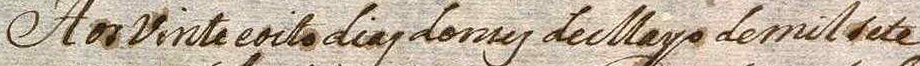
Aos vinte e oito dias do mes de Mayo de mil sete
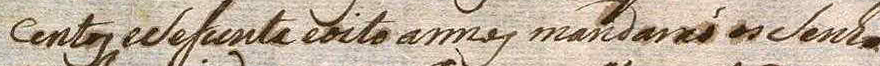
centos e sessenta e oito annos mandaraõ os Senho
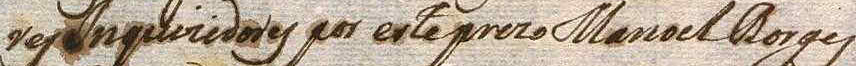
res Inquizidores por este prezo Manoel Borges
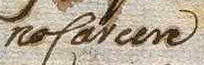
no Carcere
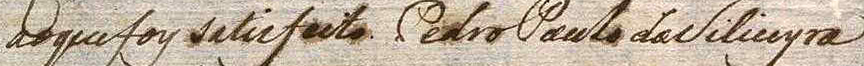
ao que foy satisfeito. Pedro Paulo da Silueyra
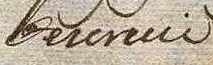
o escreui
